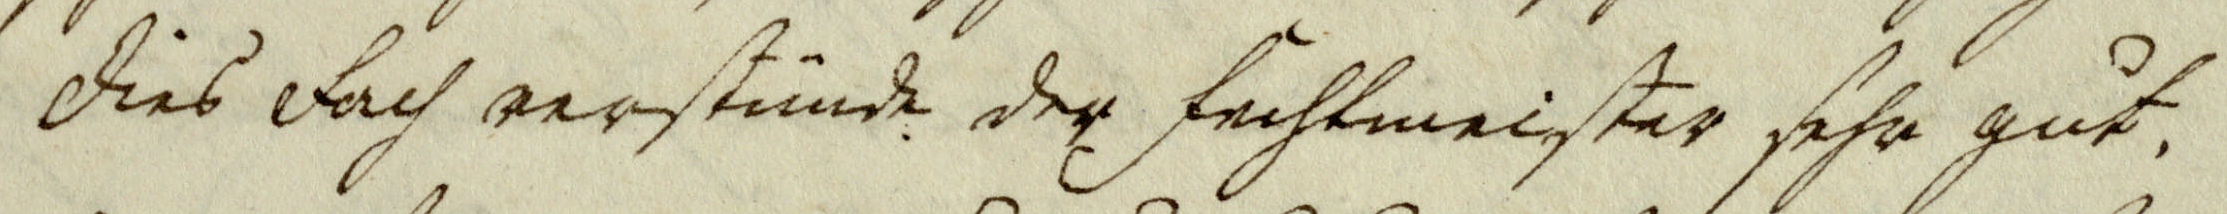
dies Fach verstünde der Fechtmeister sehr gut,
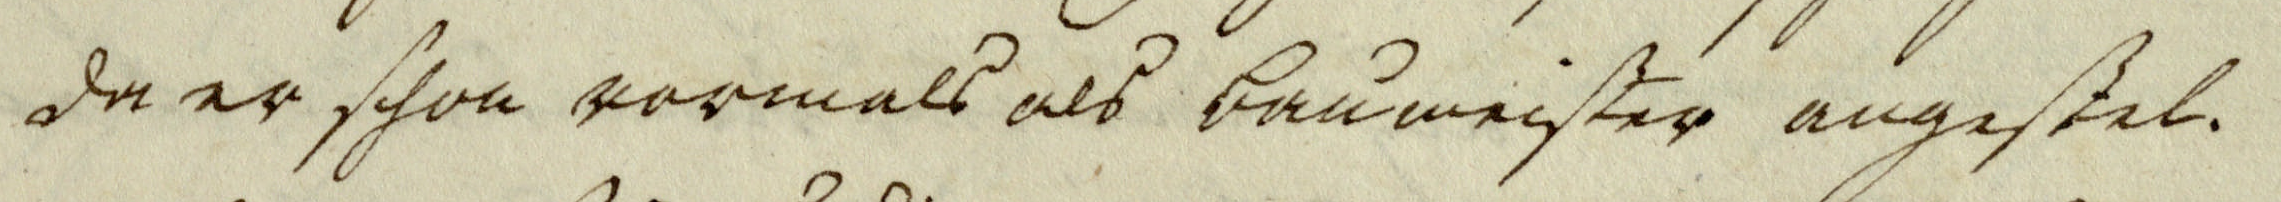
da er schon vormals als Baumeister angestel¬
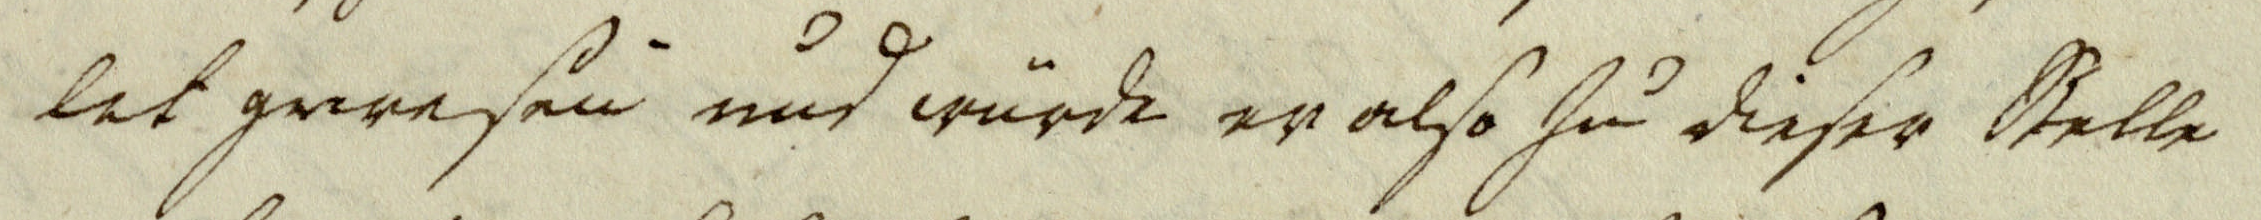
let gewesen und würde er also zu dieser Stelle
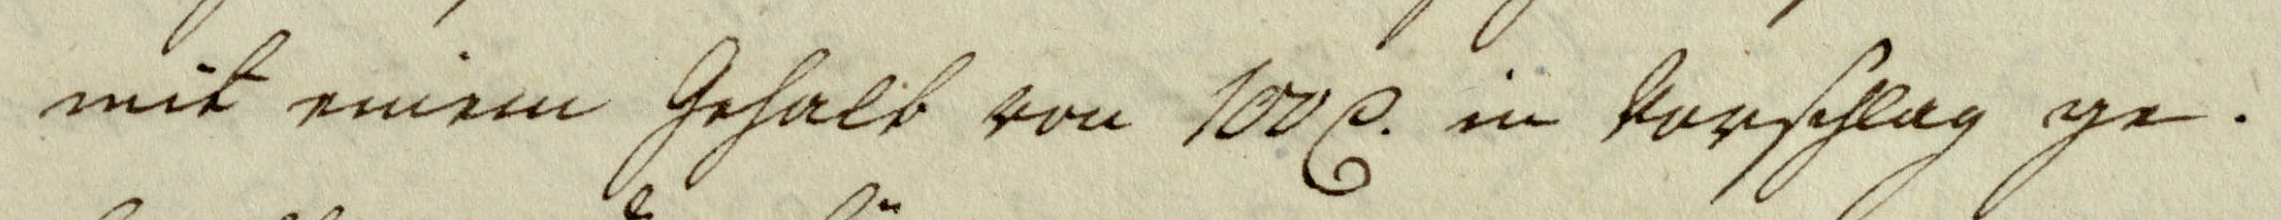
mit einem Gehalt von 100 rtl. in Vorschlag ge¬
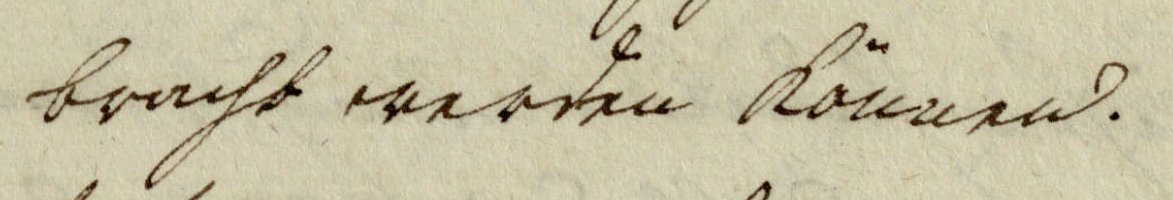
bracht werden können.
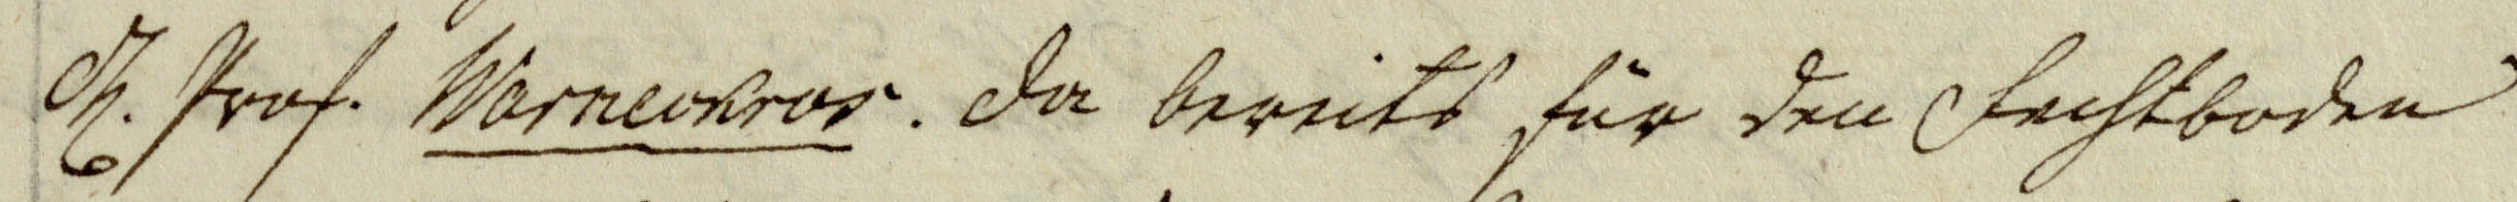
dh. Prof. Warneckros. Da bereits für den Fechtboden
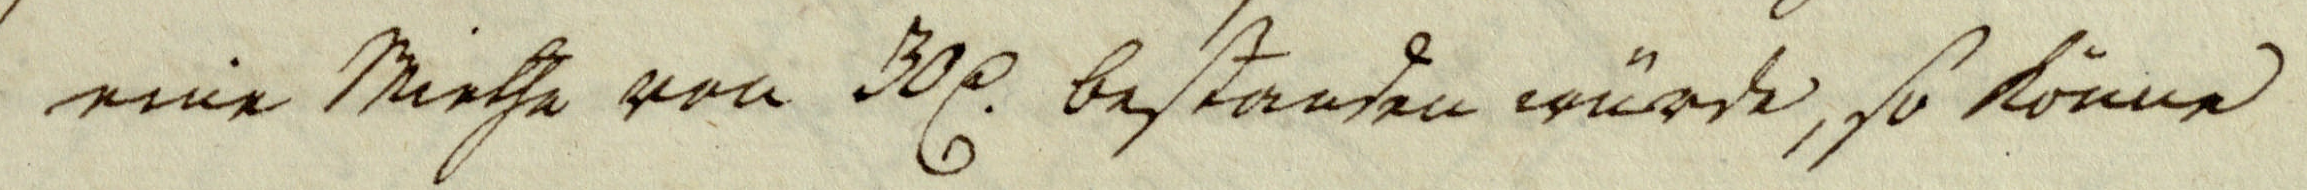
eine Miethe von 30 rtl. bestanden würde, so könne
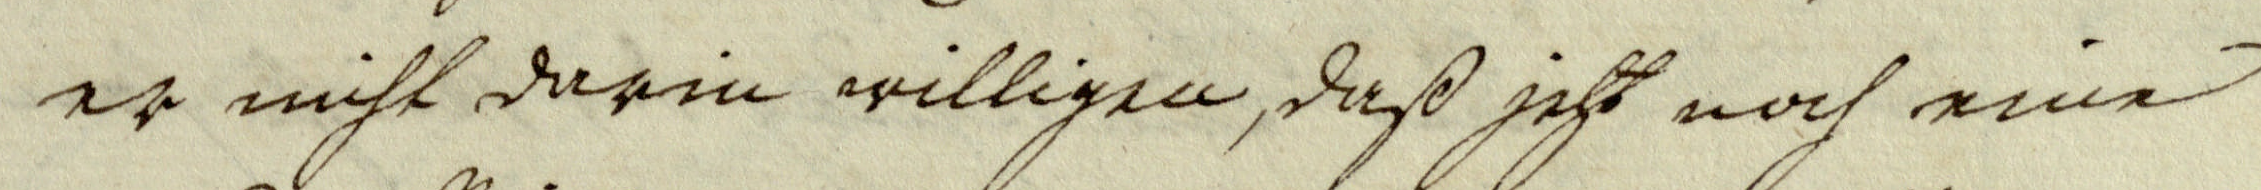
er nicht darin willigen, daß jetzt noch eine
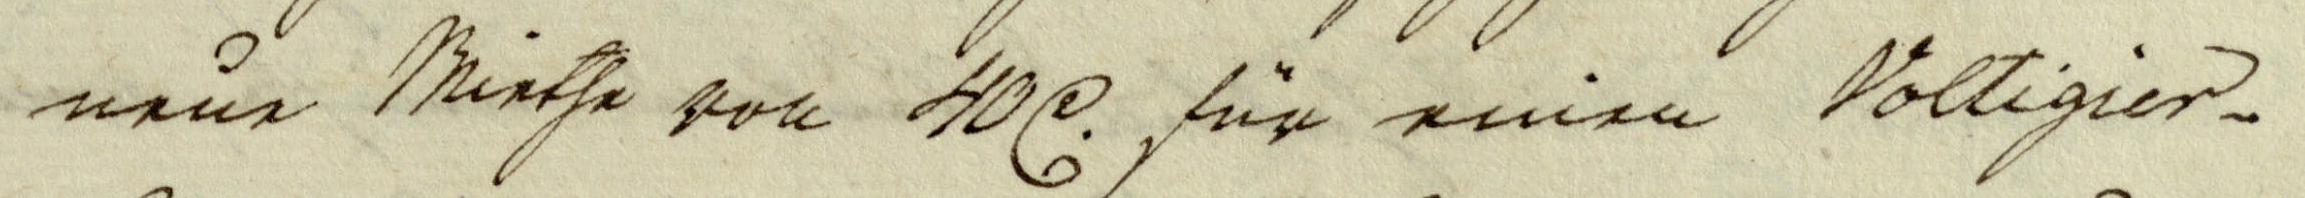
neue Miethe von 40 rtl. für einen Voltigier¬
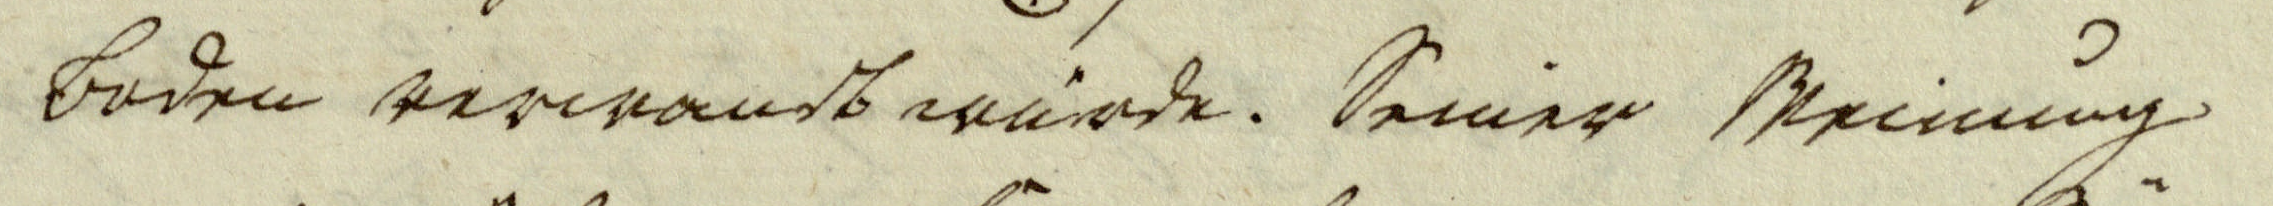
Boden verwandt würde. Seiner Meinung
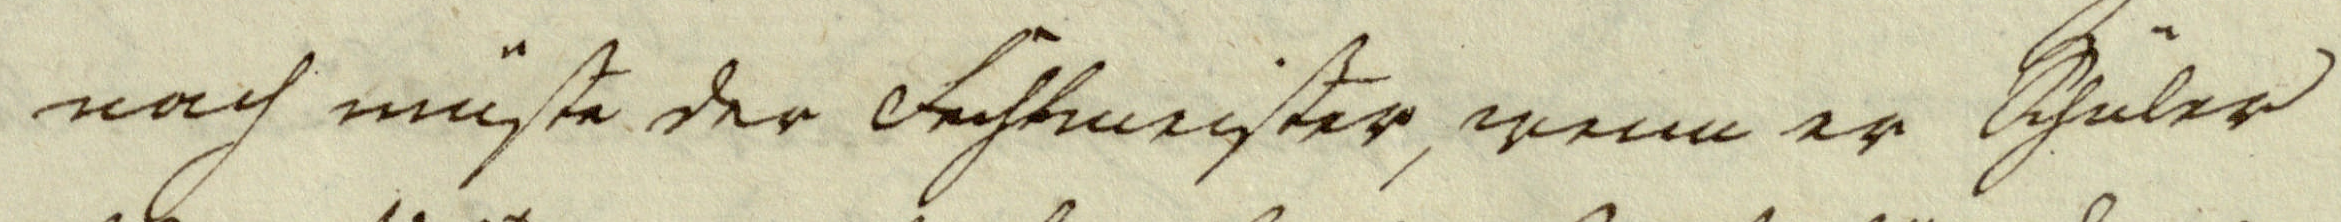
nach müsste der Fechtmeister, wenn er Schüler
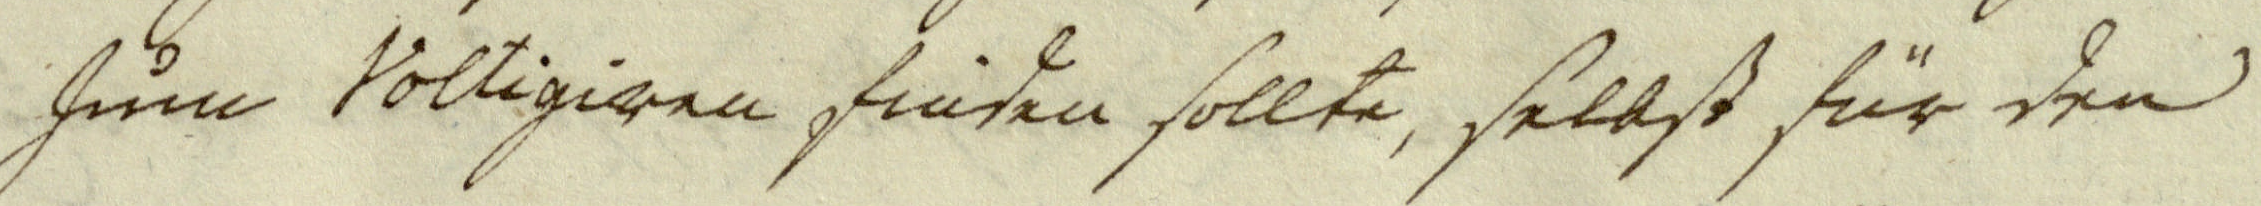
zum Voltigiren finden sollte, selbst für den
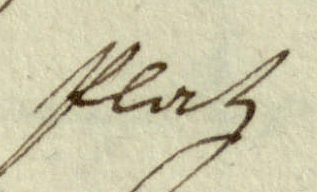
Platz
